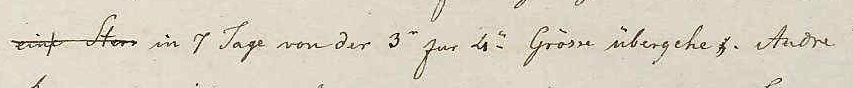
eine Stern in 7 Tage von der 3￼ zur 4￼ Grösse übergehe;. Andre
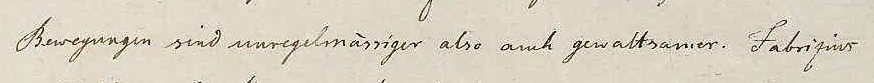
Bewegungen sind unregelmässiger also auch gewaltsamer. Fabrizius
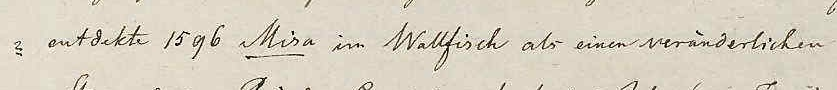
entdeckte 1596 Misa im Wallfisch als einen veränderlichen
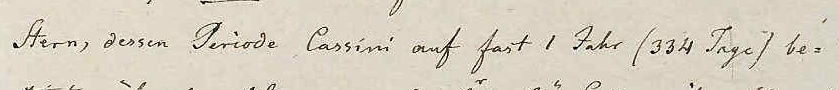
Stern, dessen Periode Cassini auf fast 1 Jahr be-
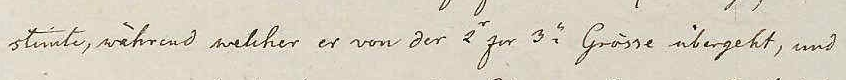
stimte, während welcher er von der 2￼ zur 3￼ Grösse übergeht, und
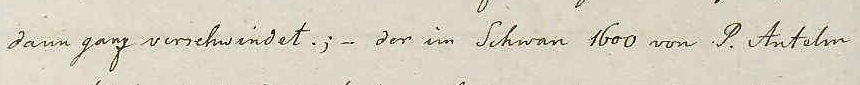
dann ganz verschwindet – der im Schwan 1600 von P. Antelm
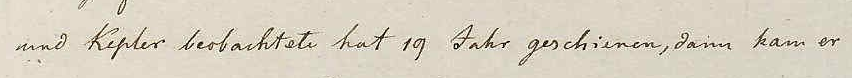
und Kepler beobachtete hat 19 Jahr geschienen, dann kam er
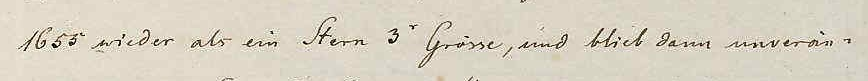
1655 wieder als ein Stern 3￼ Grösse, und blieb dann unverän-
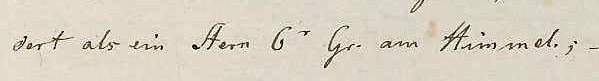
dert als ein Stern 6￼ Gr. am Himmel;
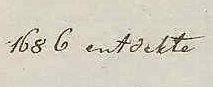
1686 entdekte
